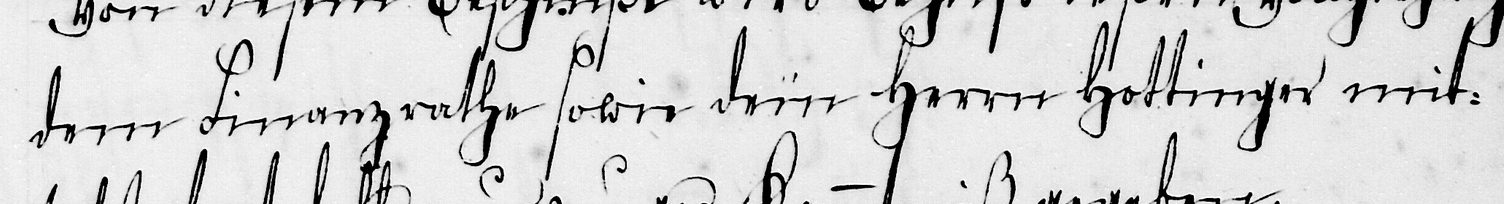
dem Finanzrathe sowie dem Herrn Hottinger mit¬
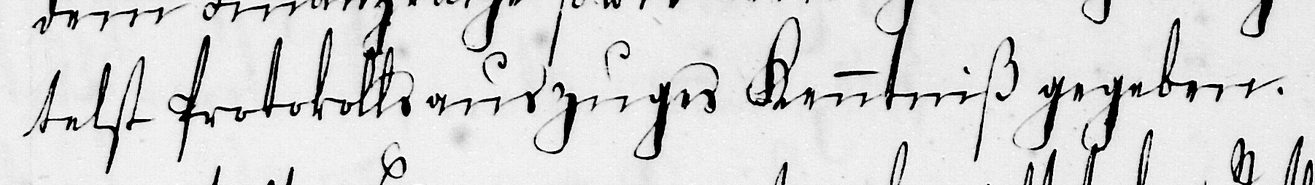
telst Protokollsauszuges Kenntniß gegeben.
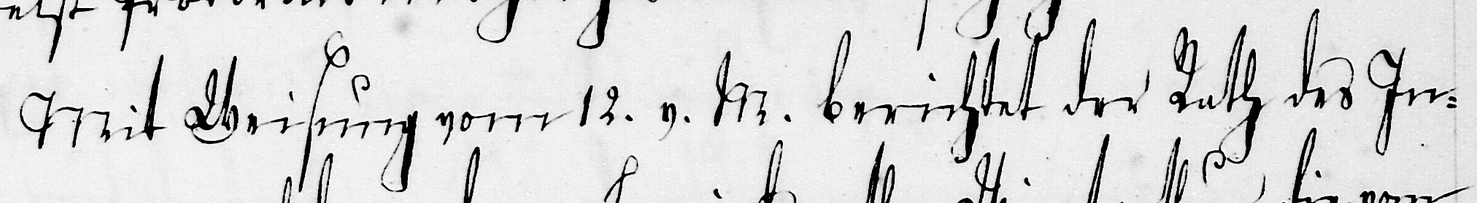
Mit Weisung vom 12. v. M. berichtet der Rath des In¬
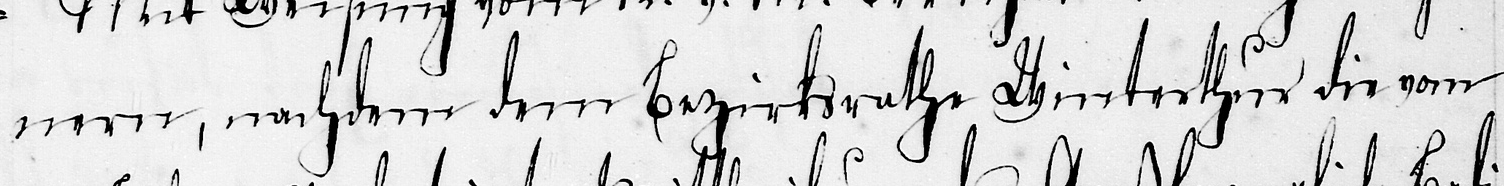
nern, nachdem dem Bezirksrathe Winterthur die vom
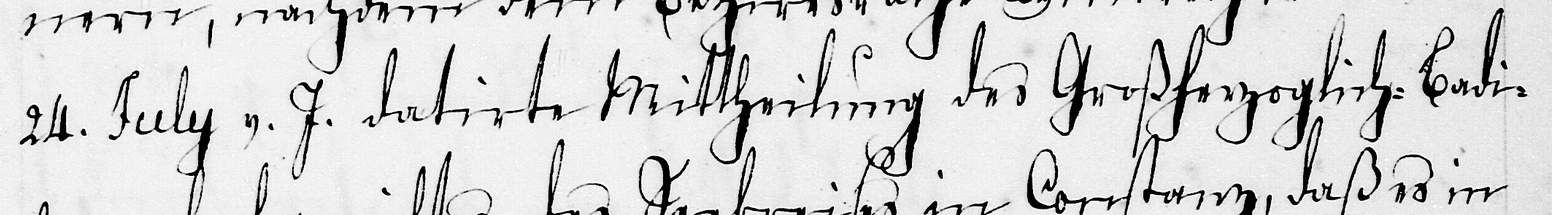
24. July v. J. datirte Mittheilung des Großherzoglich-Badi¬
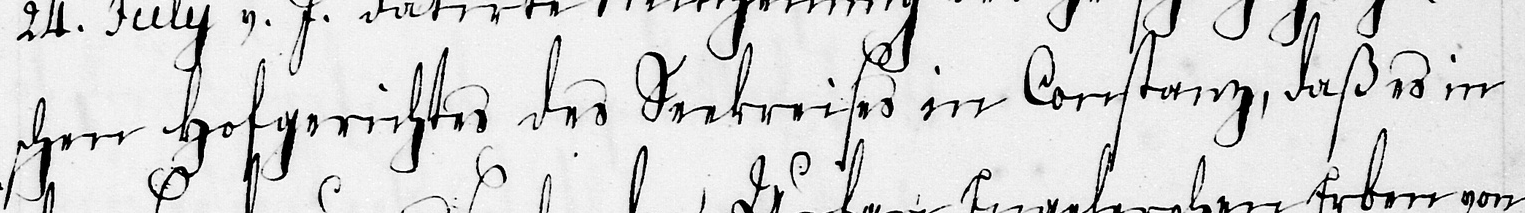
schen Hofgerichtes des Seekreises in Constanz, daß es in
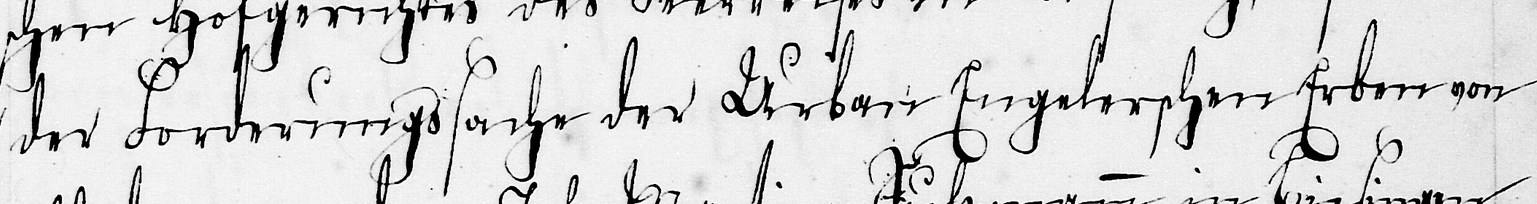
der Forderungssache der Urban Engelerschen Erben von
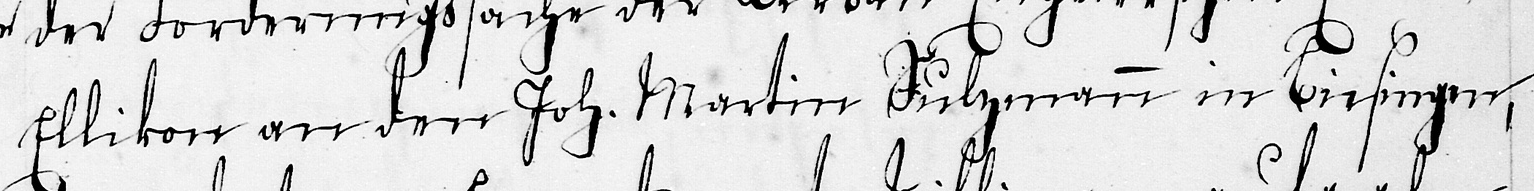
Ellikon an den Joh. Martin Sulzmann [sic!] in Biesingen,
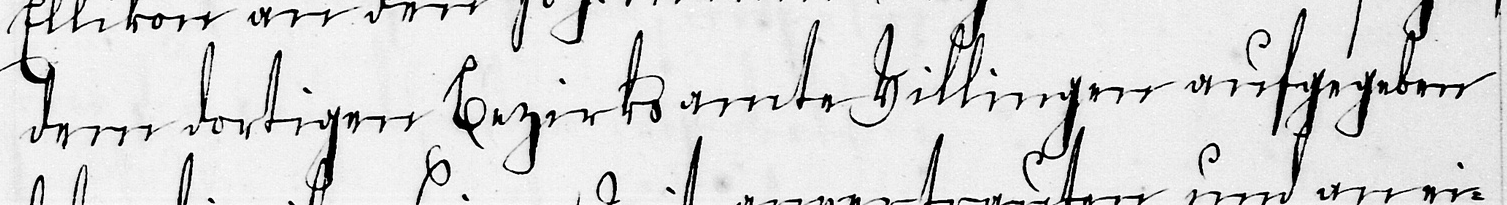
dem dortigen Bezirksamte Villingen aufgegeben
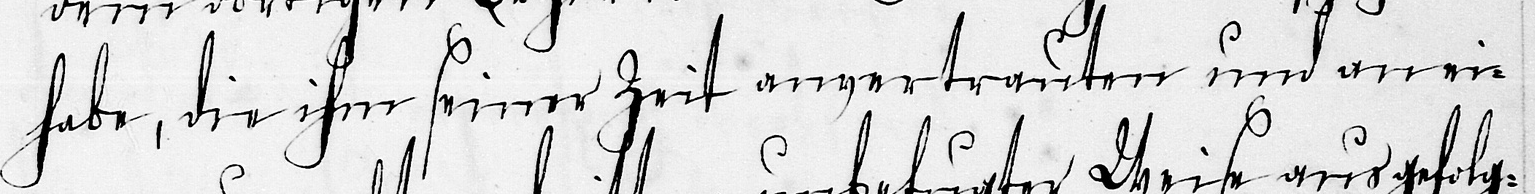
habe, die ihm seiner Zeit anvertrauten und an ei¬
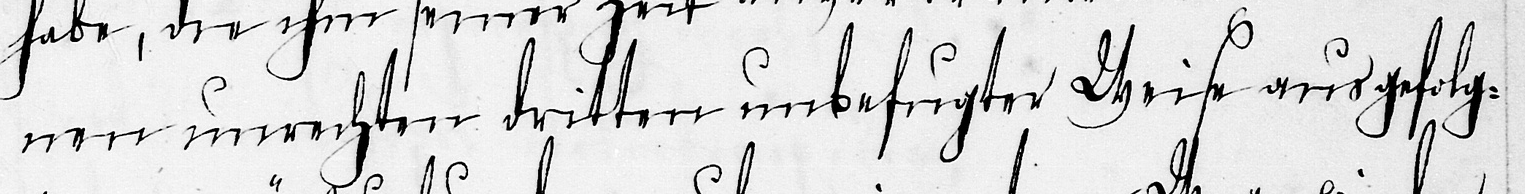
nen unrechten dritten unbefugter Weise ausgefolg¬
